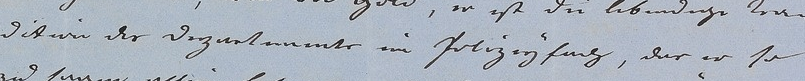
dition des Departements im Polizeyfach, das er so
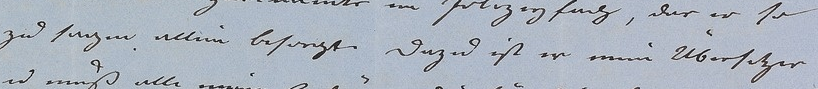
zu sagen allein besorgt. Dazu ist er mein Übersetzer
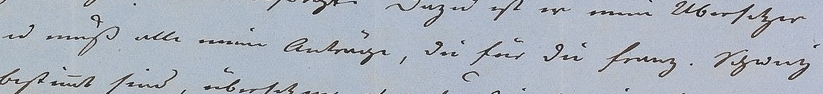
u muß alle meine Anträge, die für die franz. Schweiz
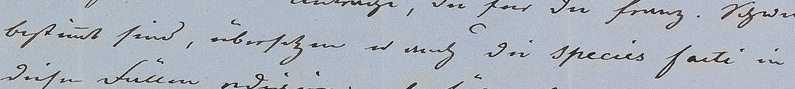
bestimmt sind, übersetzen u noch die species facti in
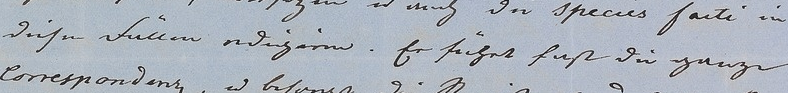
diesen Fällen redigiren. Er führt fast die ganze
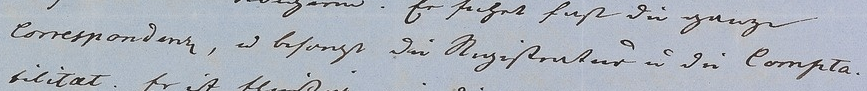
Correspondenz, u besorgt die Registratur u die Compta-
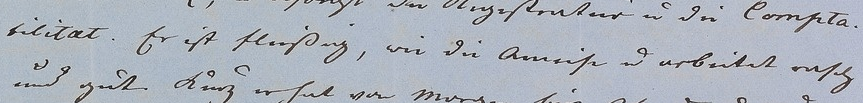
bilitæt. Er ist fleißig, wie die Ameise u arbeitet rasch
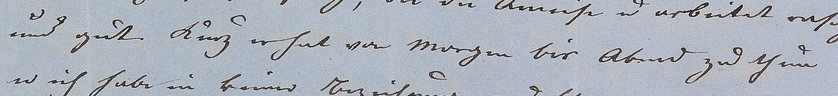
und gut. Kurz er hat von Morgen bis Abend zu thun
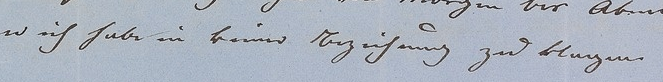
u ich habe in keiner Beziehung zu klagen.
